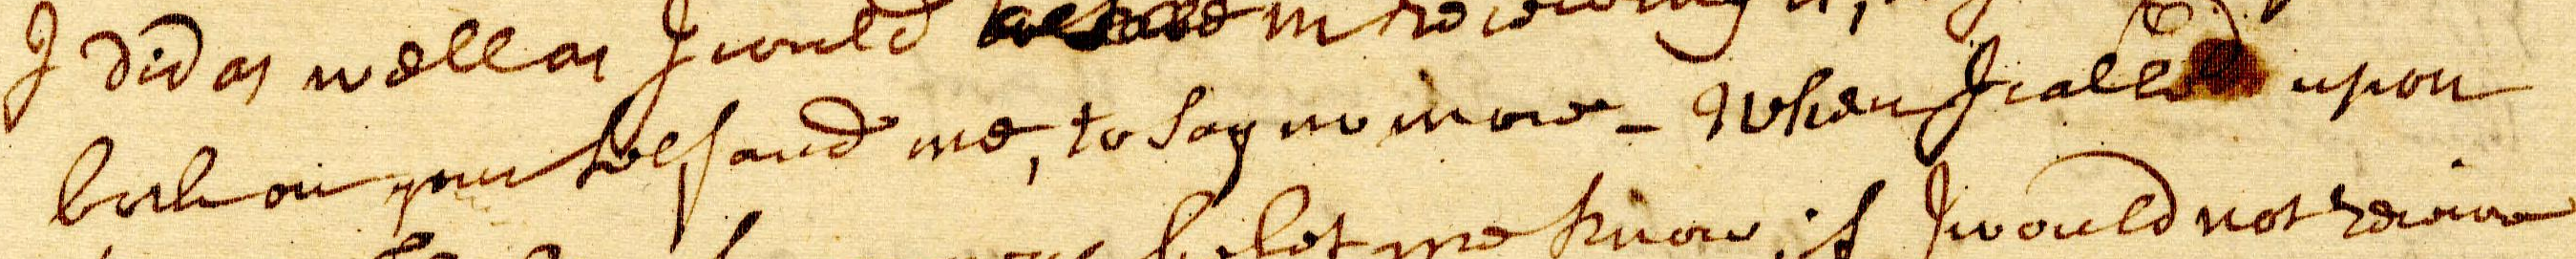both on your self and me, to say no more- When I called upon
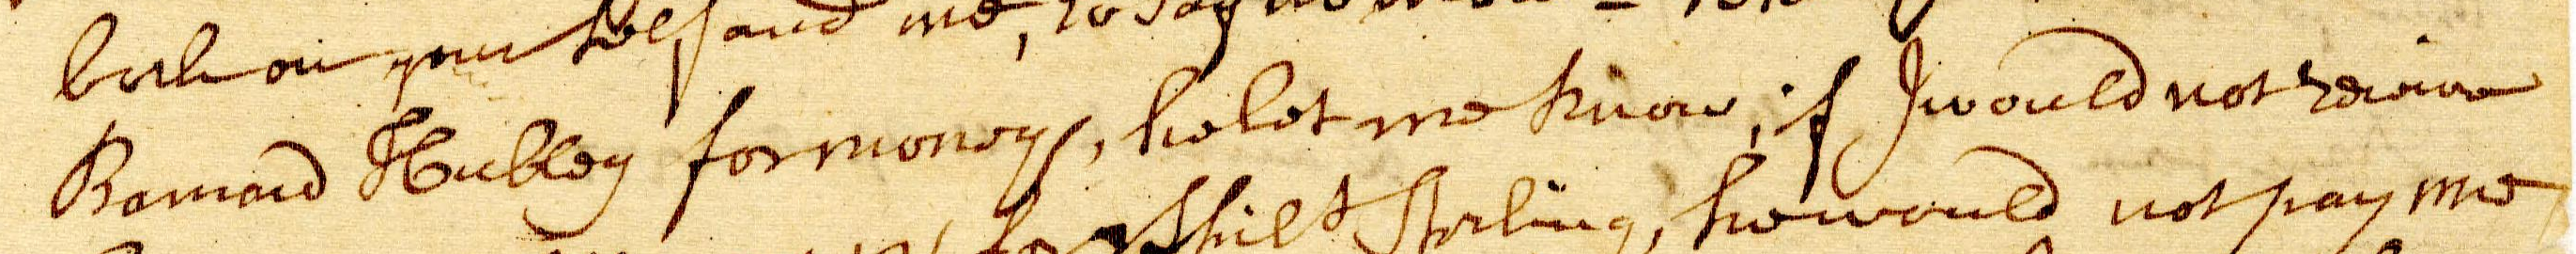Barnard Hubley for money, he let me know; if I would not receive
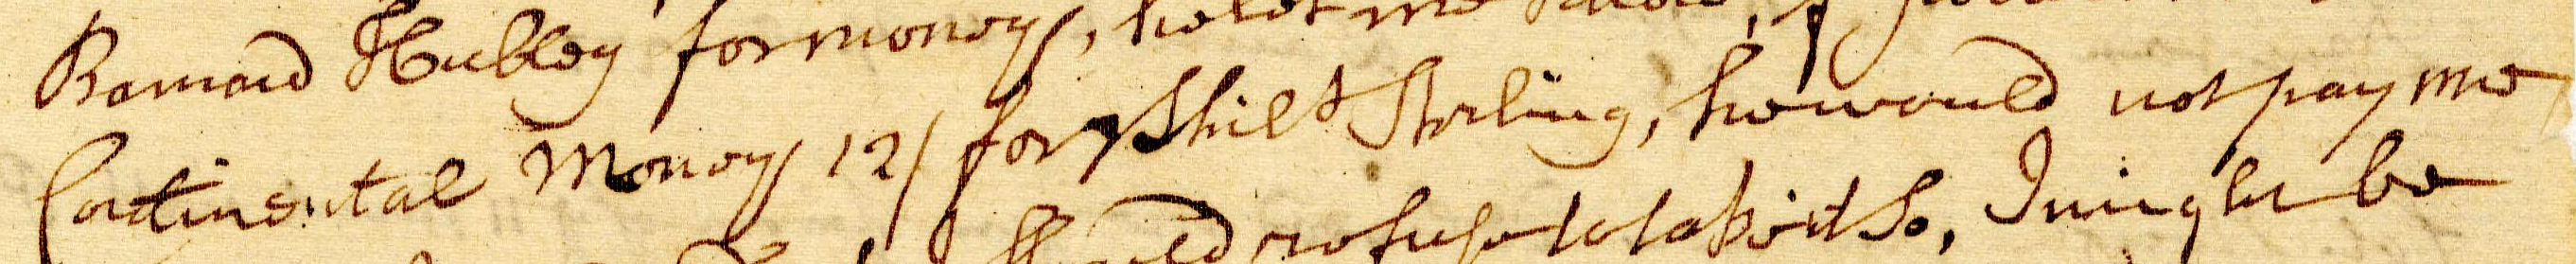Continental Money 12s for Shil^s Sterling, he would not pay me
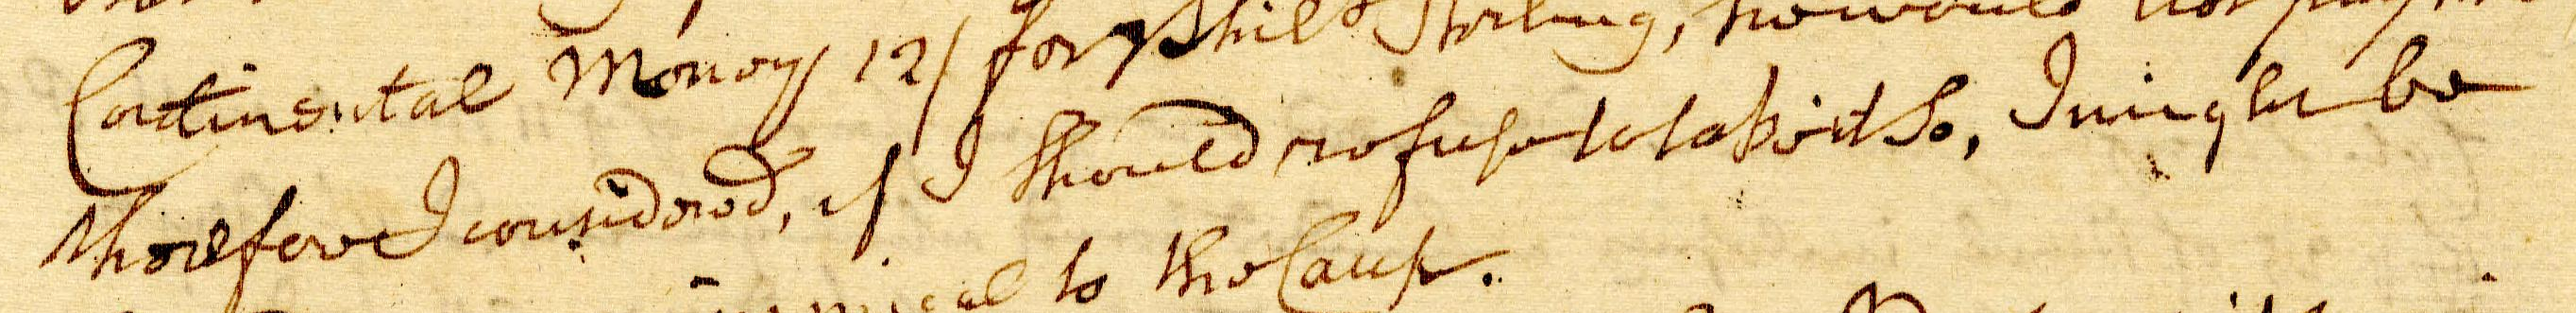therefore I considered, if I should refuse to take it So, I might be
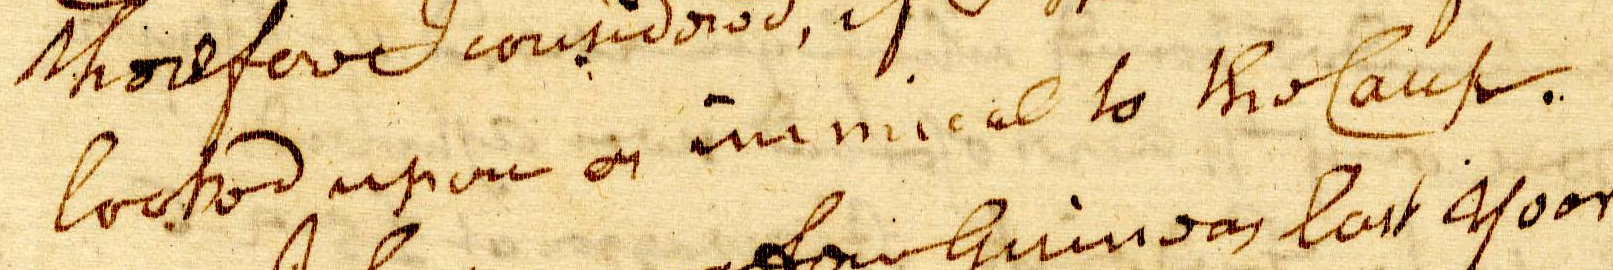looked upon as inimical to the Cause.
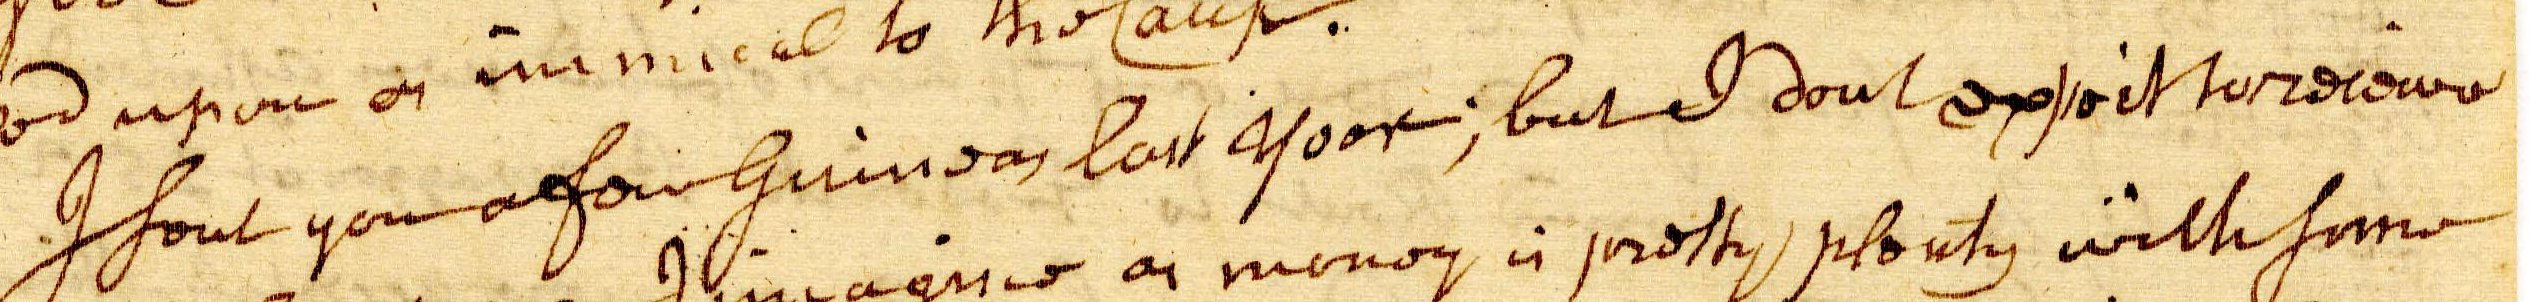I sent you a few Guineas last Year; but I dont expect to recieve
